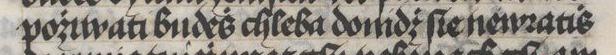pożiwati budeṡ chleba donídż ſie newratiṡ
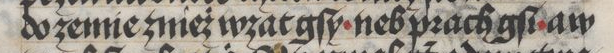do zemie znież wzat gſy.neb prach gſi.a w
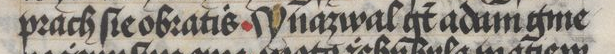prach ſíe obratiṡ.Y nazwal ḡt adam gme¬
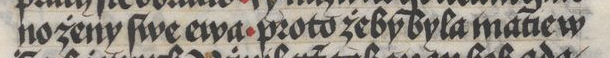no żeny ſwe ewa.proto żeby byla matie w
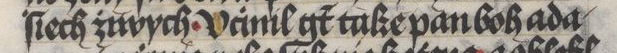ẛiech żiwych.Vċinil ḡt take pan boh ada¬
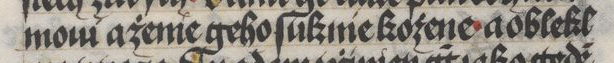moui a żenie geho ſukníe kożene.a oblekl
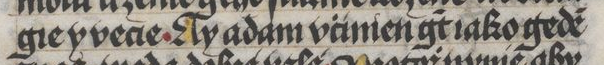gie y vecie.Ty adam vċínien ḡt iako gedē
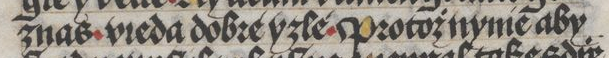znas.vieda dobré y zlé.Protoż nyníe aby
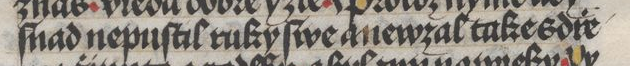ſnad nepuſtil ruky ſwe a newzal take sdṙe¬
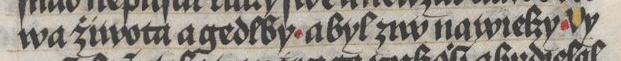wa żíwota a gedlby.a byl ziw na wieky. Vy¬
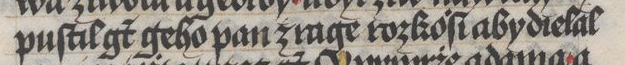puſtil ḡt geho pan z rage rozkoẛí aby dielal
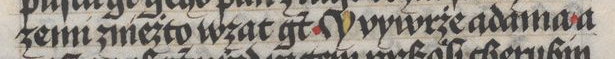zemi zníeżto wzat ḡt.Y vywrże adama.a
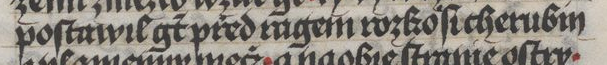poſtawil ḡt pṙed ragem rozkoẛi cherubín
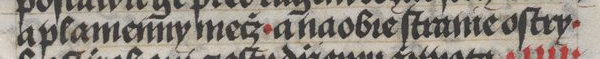a plamenny mecż.a na obie ſtranie oſtry.
